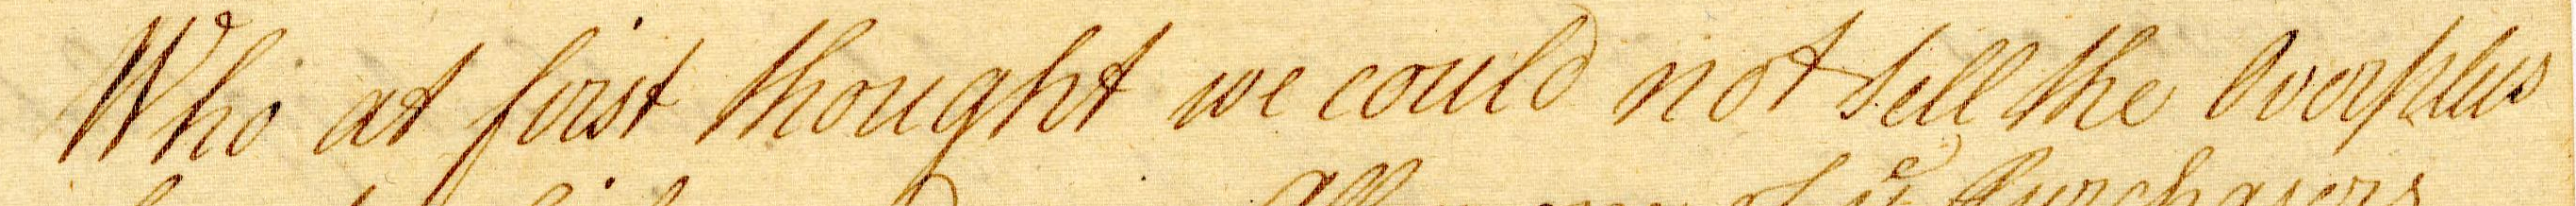Who at first thought we could not sell the overplus
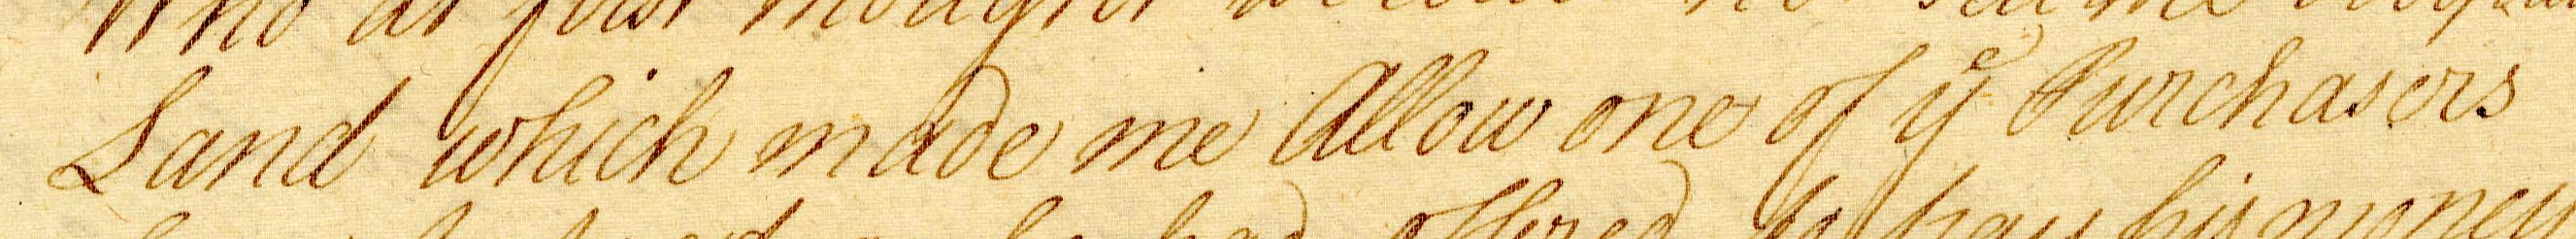Land which made me Allow one of y^e Purchasers
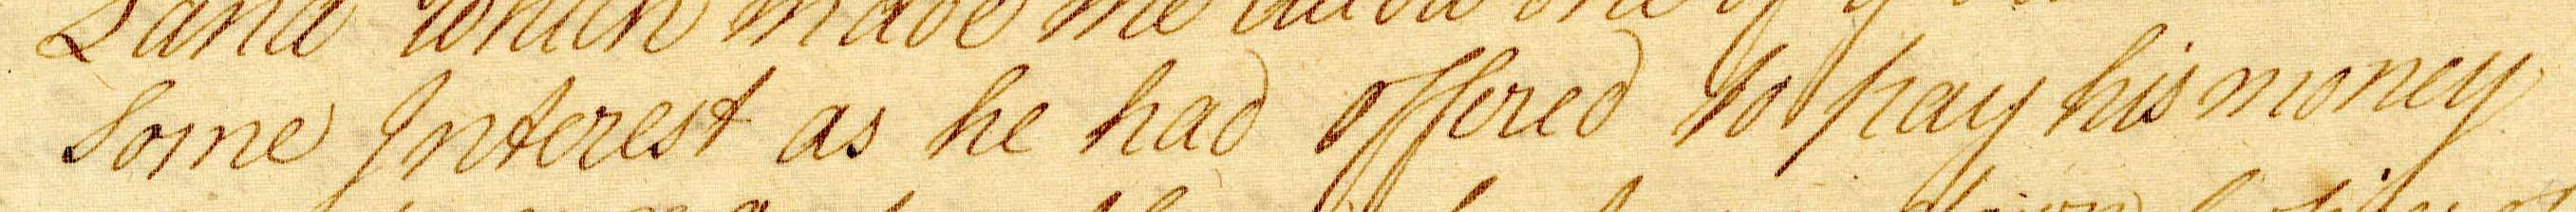Some Interest as he had offered to pay his money
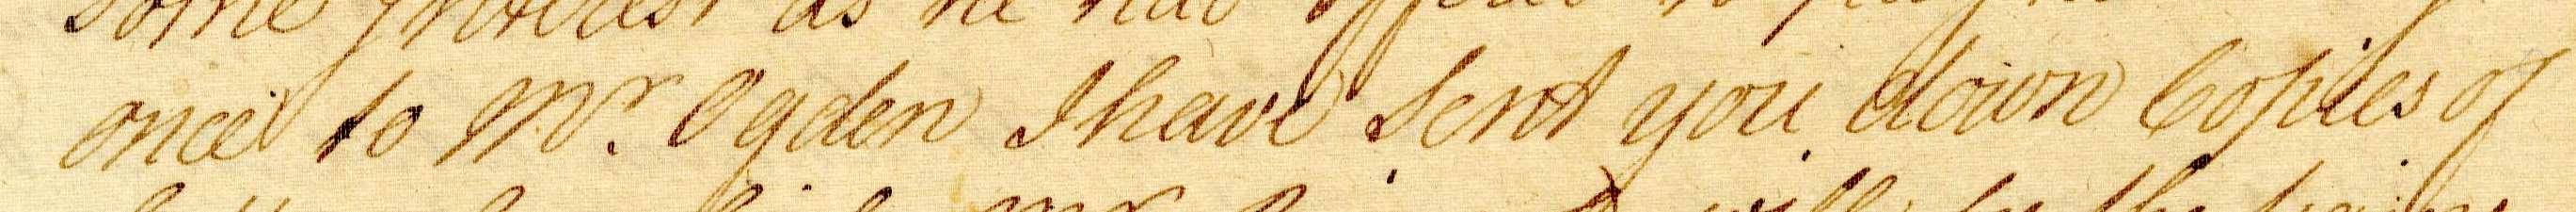once to M^r. Ogden I have Sent you down Copies of
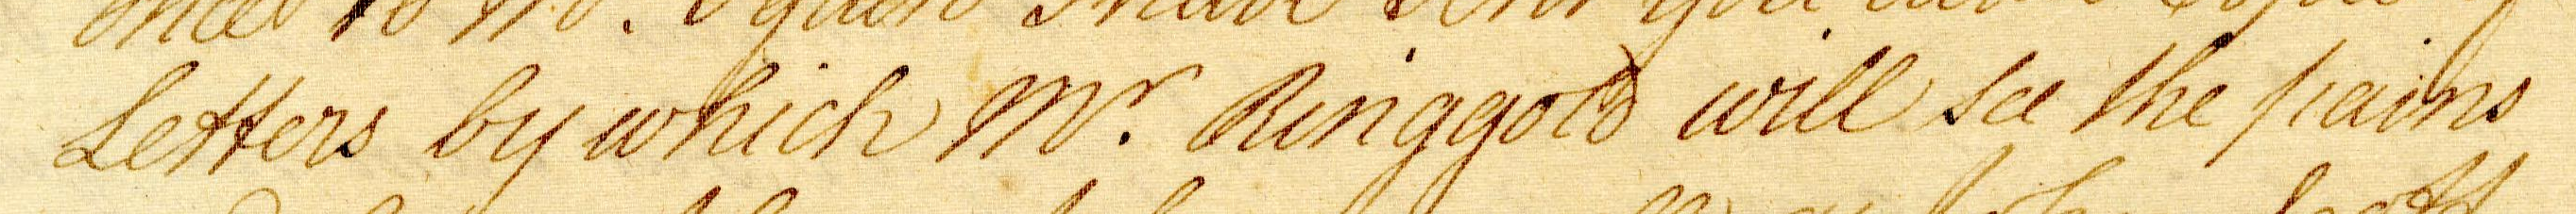Letters by which M^r. Ringgold will see the pains
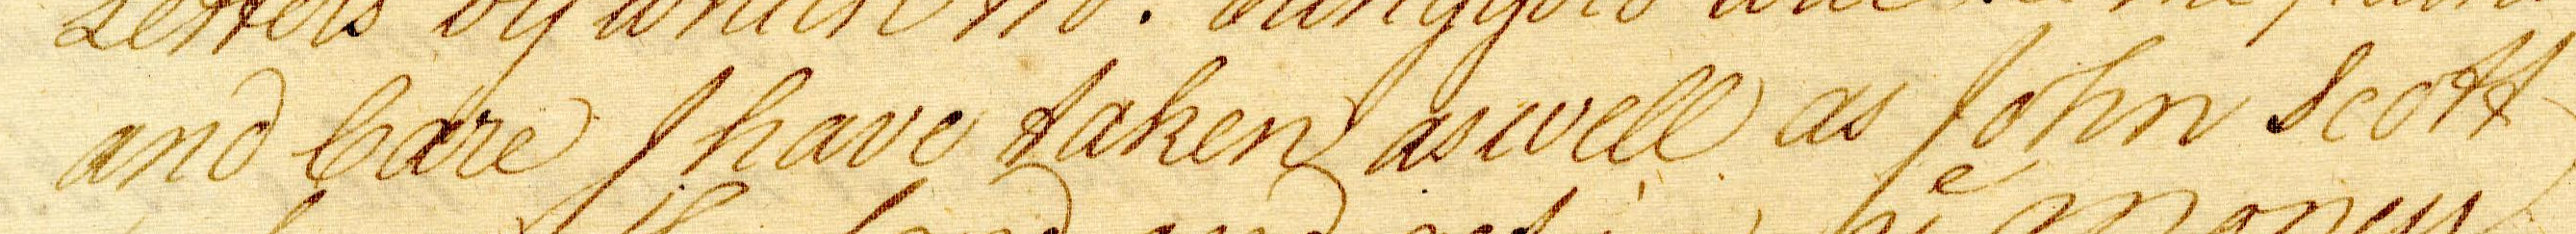and Care I have taken as well as John Scott
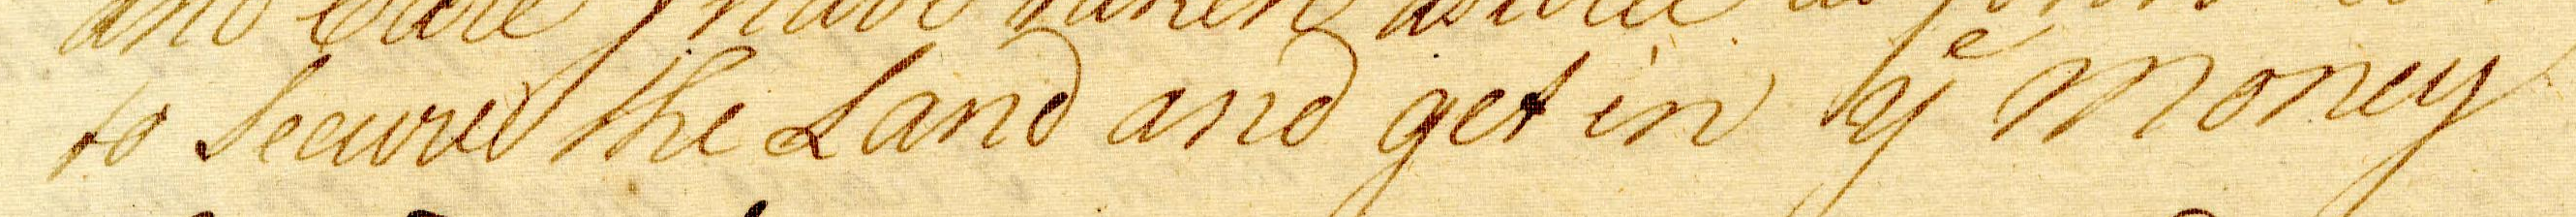to Secure the Land and get in y^e Money
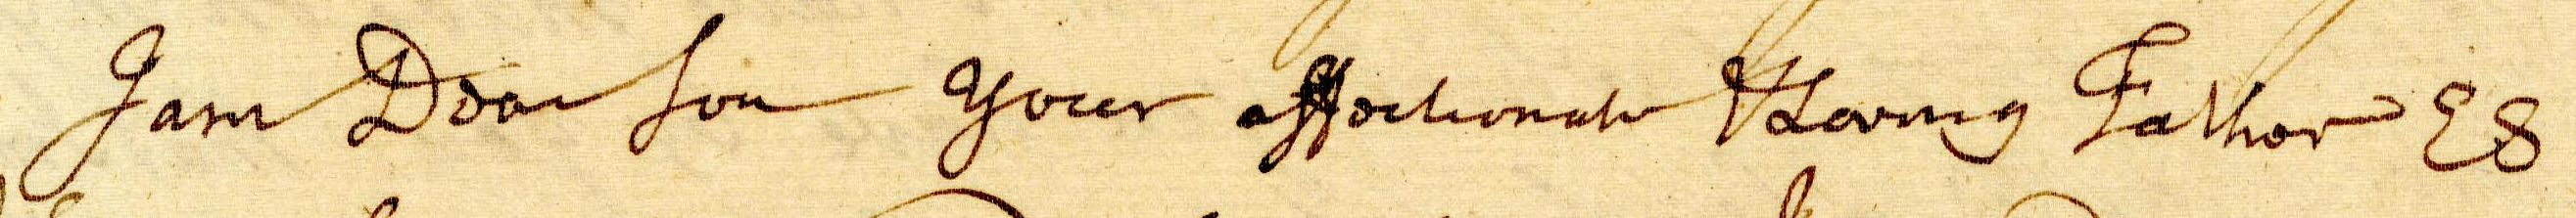I am Dear Son Your affectionate & Loving Father ES
